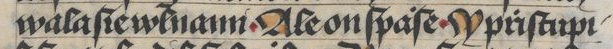wala ſie wlnami.Ale on ſpaẛe.Y pṙiſtupi¬
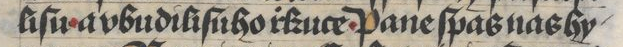li ſu.a vbudili ſu ho ṙkuce.Pane ſpas nas hy¬
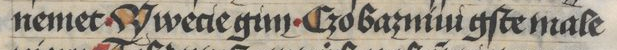nemet.Y wecie gim.Czo bazniui gſte male
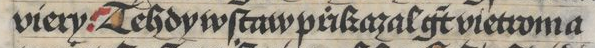viery?Tehdy wſtaw pṙikazal ḡt vietrom a
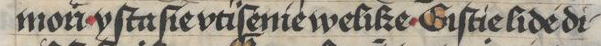moṙi.y ſtaſie vtiẛeníe welike.Giſtíe lidé di¬
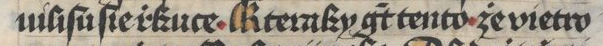uili ſu ſie ṙkuce.Kteraky ḡt tento.ze vietro¬
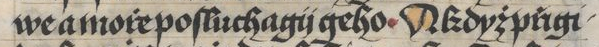we a moṙe poſluchagij geho.A kdyż pṙigi¬
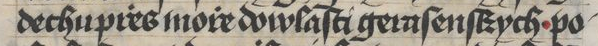dechu pṙes moṙe do wlaſti geraſenſkych.po¬
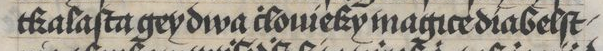tkalaſta gey dwa ċlouíeky magice diabelſt¬
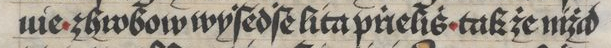uie.zhrobow wyẛedẛe líta pṙieliṡ.tak że niżad¬
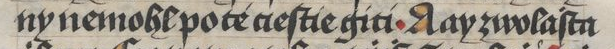ny nemohl poté cieſtie gítí.A ay zwolaẛta
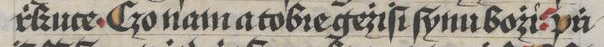ṙkuce.Czo nam a tobie geżiẛi ſynu bożi.pṙi¬
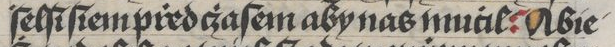ẛelſi ſiem pṙed cżaſem aby nas muċil?A bíe¬
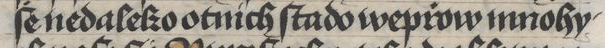ẛe nedaleko otních ſtado wepṙow mnohy¬
